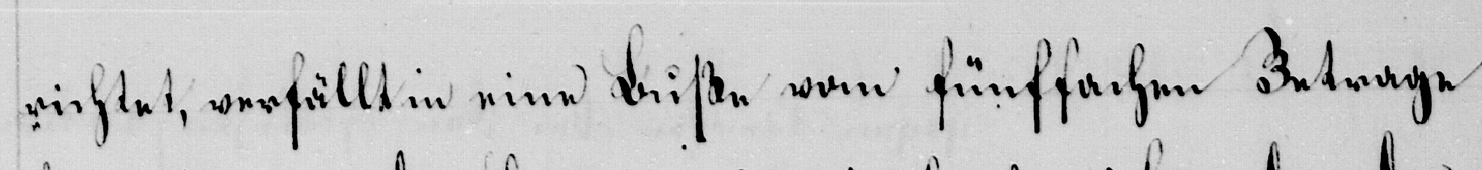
richtet, verfällt in eine Buße vom fünffachen Betrage
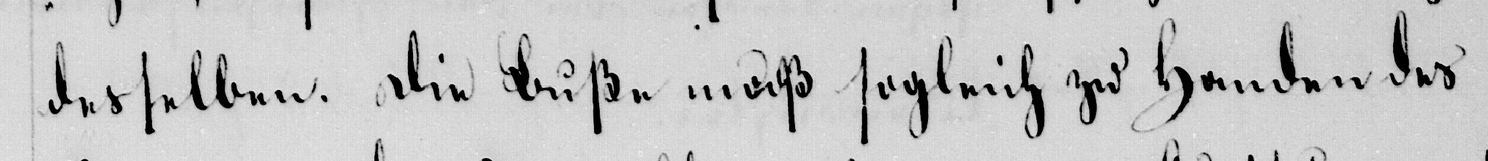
desselben. Die Buße muß sogleich zu Handen des
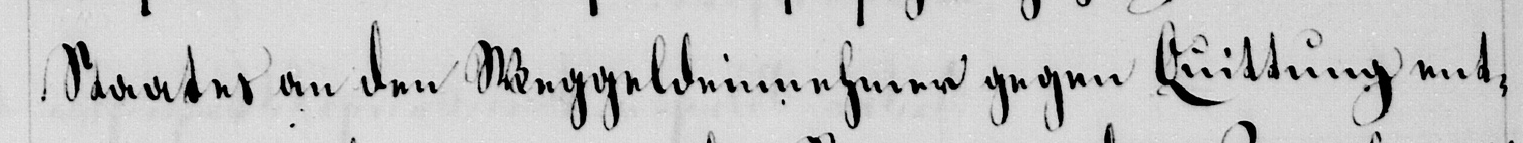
Staates an den Weggeldeinnehmer gegen Quittung ent¬
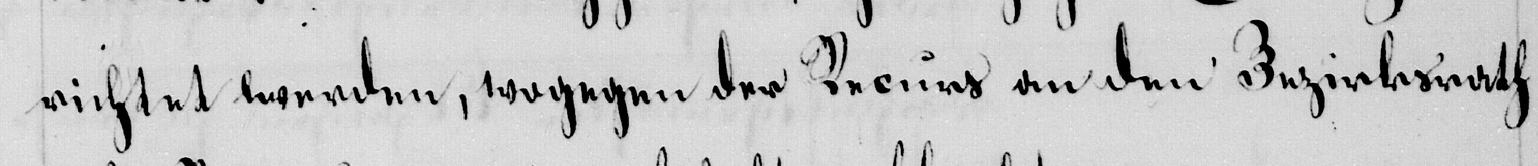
richtet werden, wogegen der Recurs an den Bezirksrath
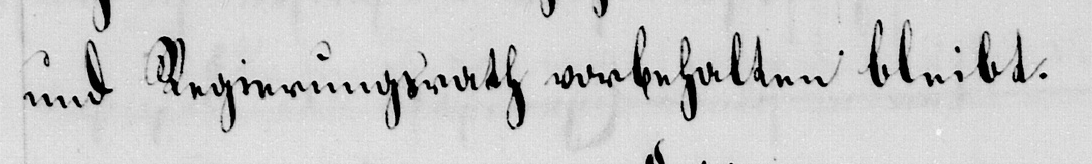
und Regierungsrath vorbehalten bleibt.
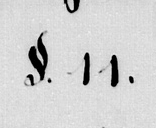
§. 11.
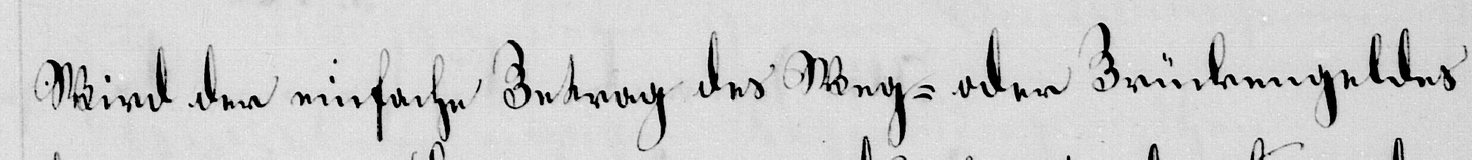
Wird der einfache Betrag des Weg- oder Brückengeldes
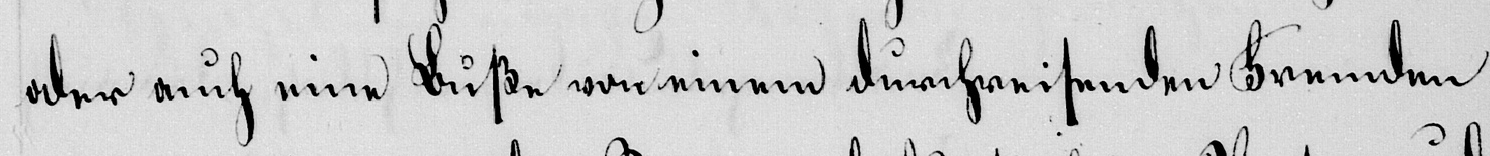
oder auch eine Buße von einem durchreisenden Fremden
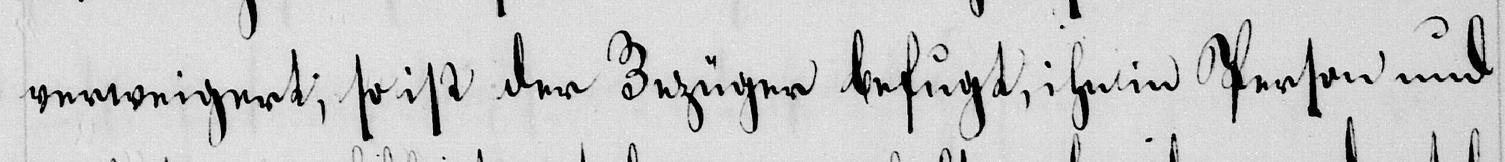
verweigert, so ist der Bezüger befugt, ihn in Person und
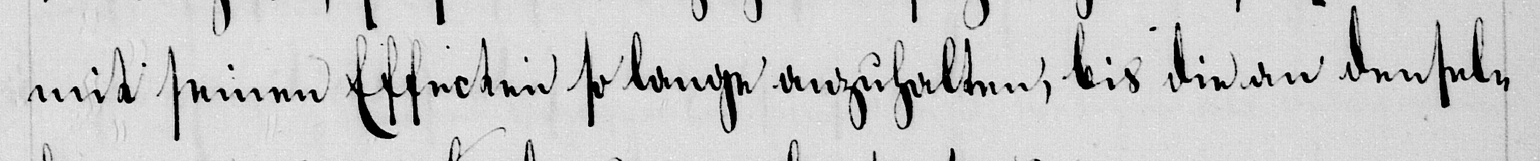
mit seinen Effecten so lange anzuhalten, bis die an densel¬
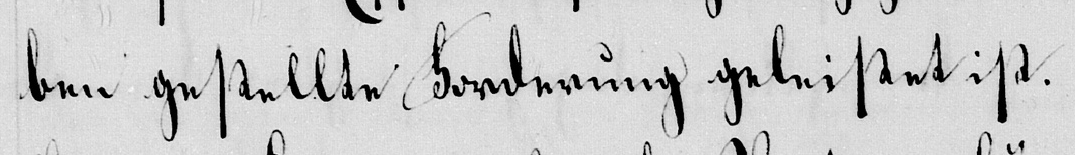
ben gestellte Forderung geleistet ist.
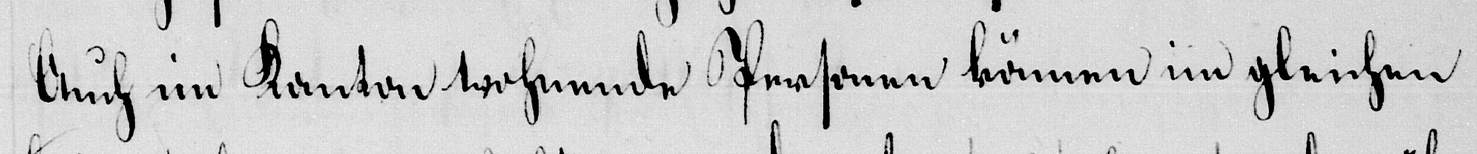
Auch im Kanton wohnende Personen können im gleichen
